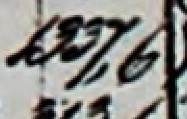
1337,6
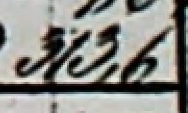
313,6
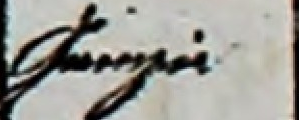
Gamzie
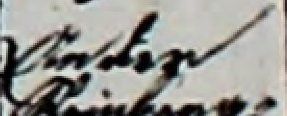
An der
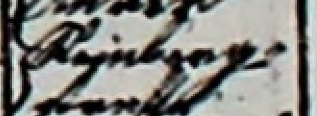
Steinberg„
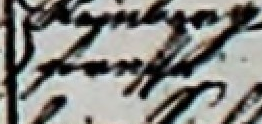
strasse
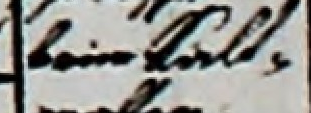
bein Sall„
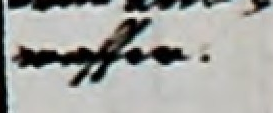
wasser
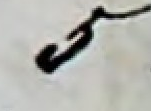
5
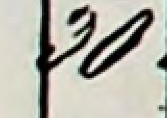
30
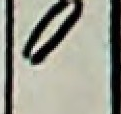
6
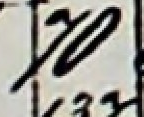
70
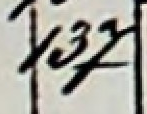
137
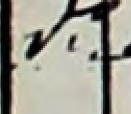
Do
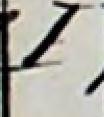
I
